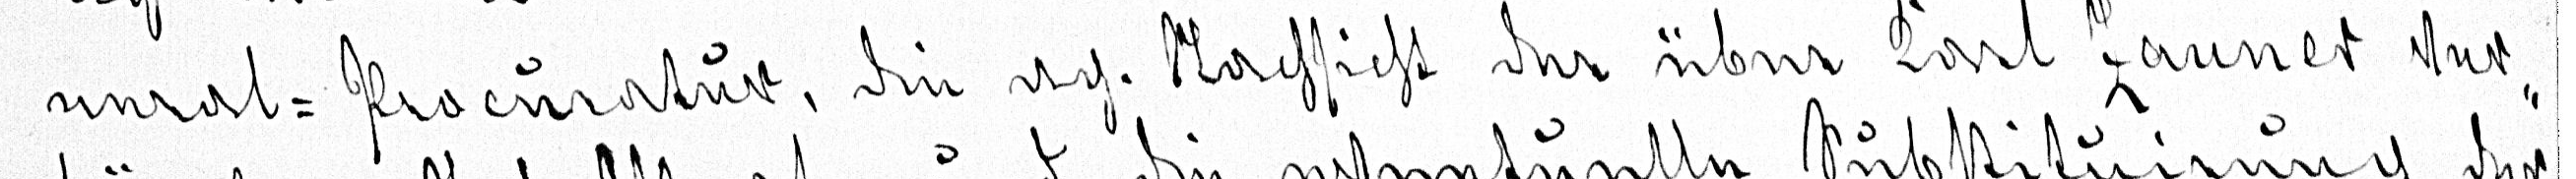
neral = Procuratur, die ag. Nachsicht der über Karl Zauner ver¬
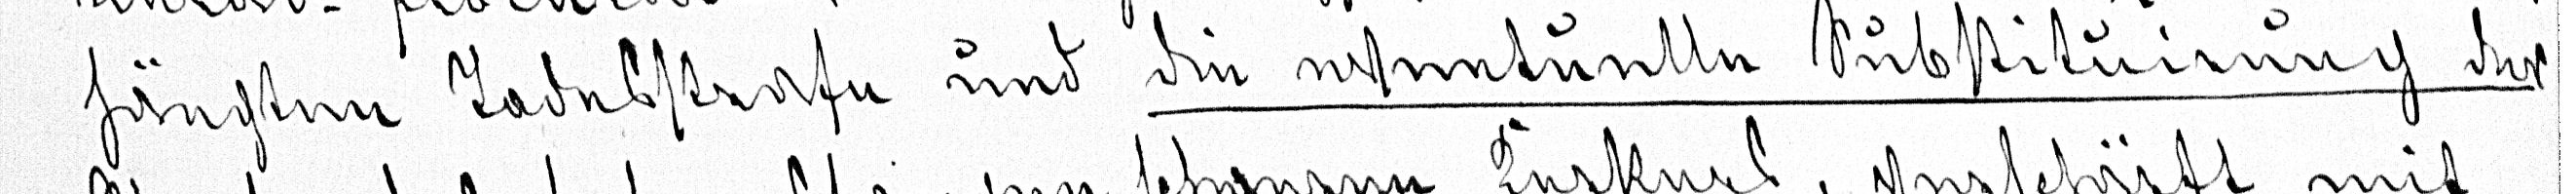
hängten Todesstrafe und die eventuelle Substituirung der
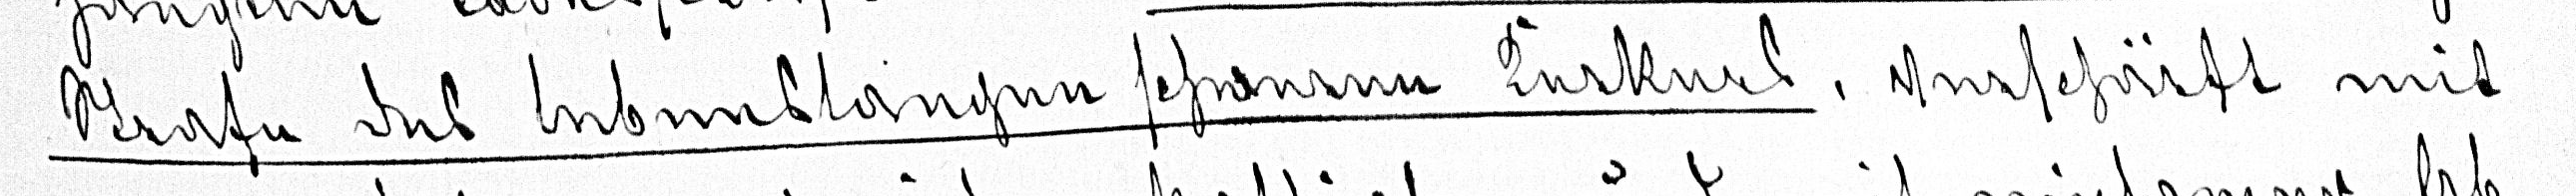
Strafe des lebenslangen schweren Kerkers, verschärft mit
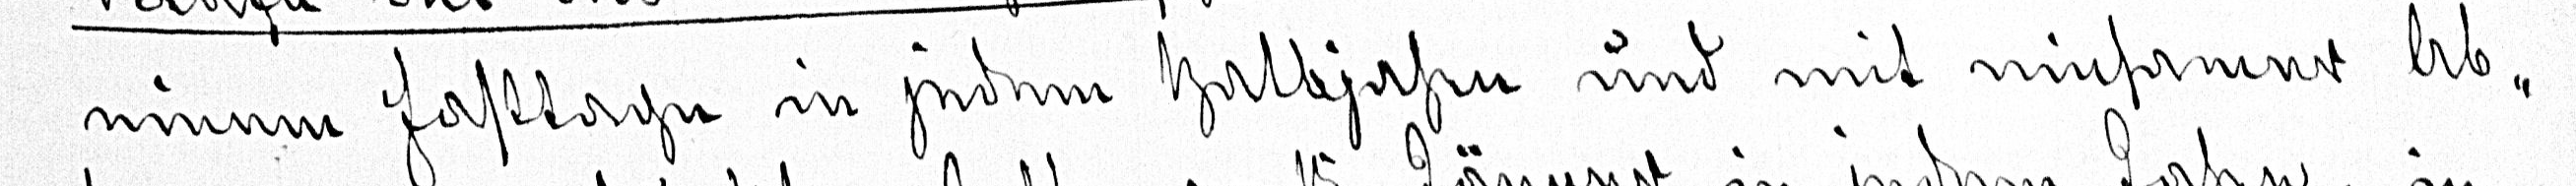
einem Fasttage in jedem Halbjahre und mit einsamer Ab¬
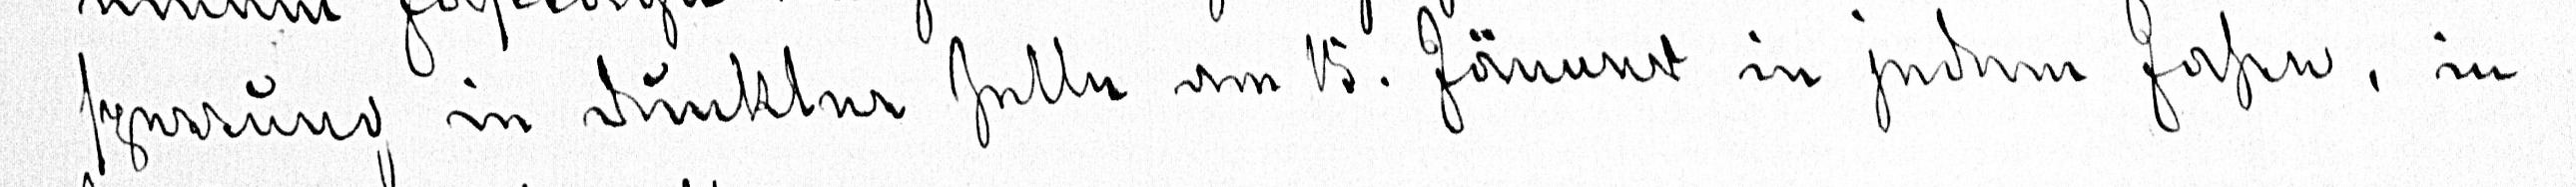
sperrung in Dunkler Zelle am 15. Jänner in jedem Jahr, in
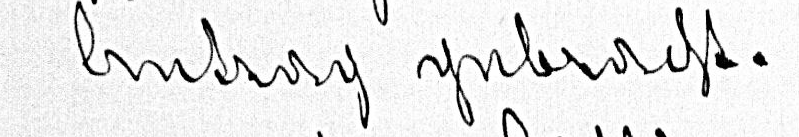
Antrag gebracht.
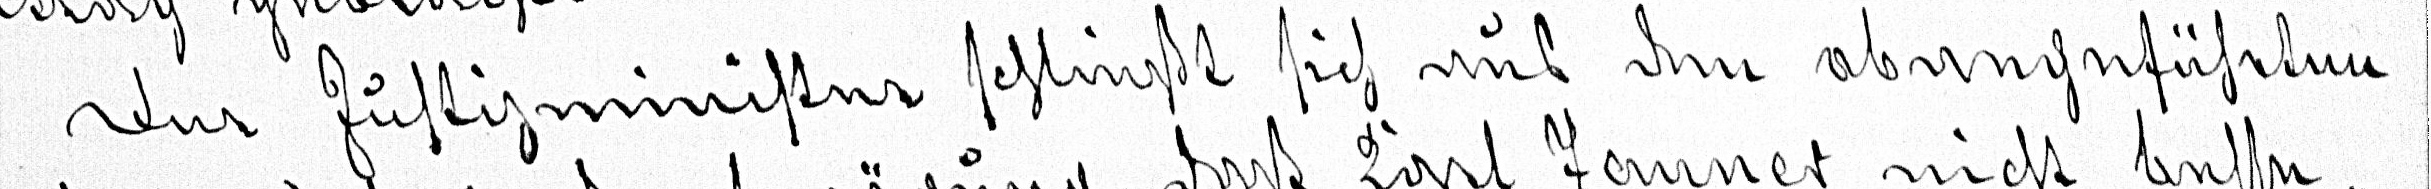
Der Justizminister schließt sich aus dem ob angeführten
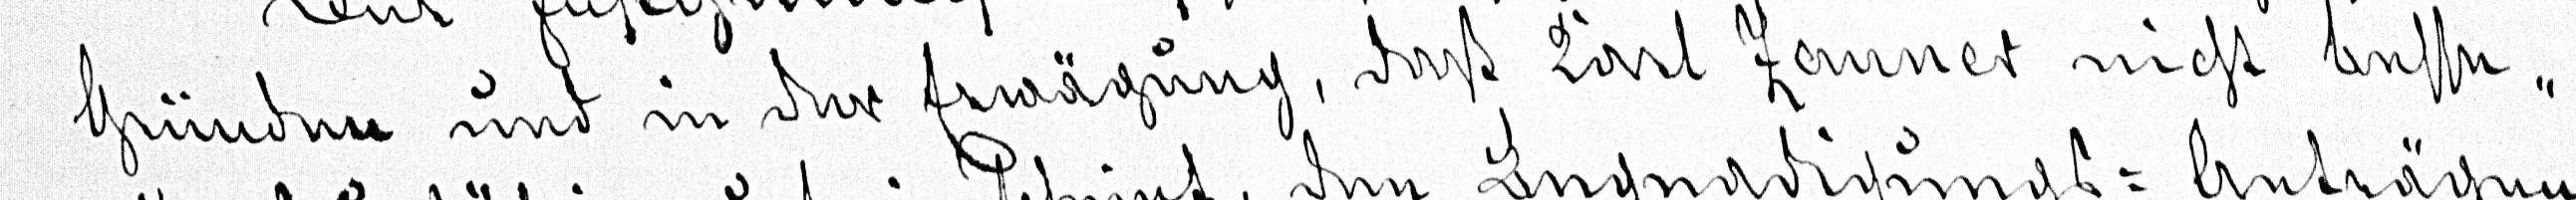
Gründen und in der Erwägung, daß Karl Zauner nicht besse¬
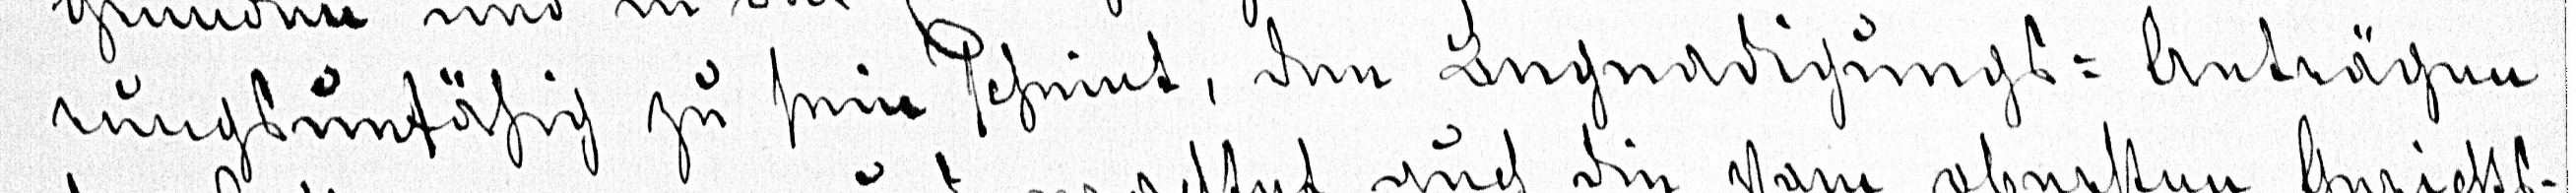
rungsunfähig zu sein scheint, den Begnadigungs = Anträgen
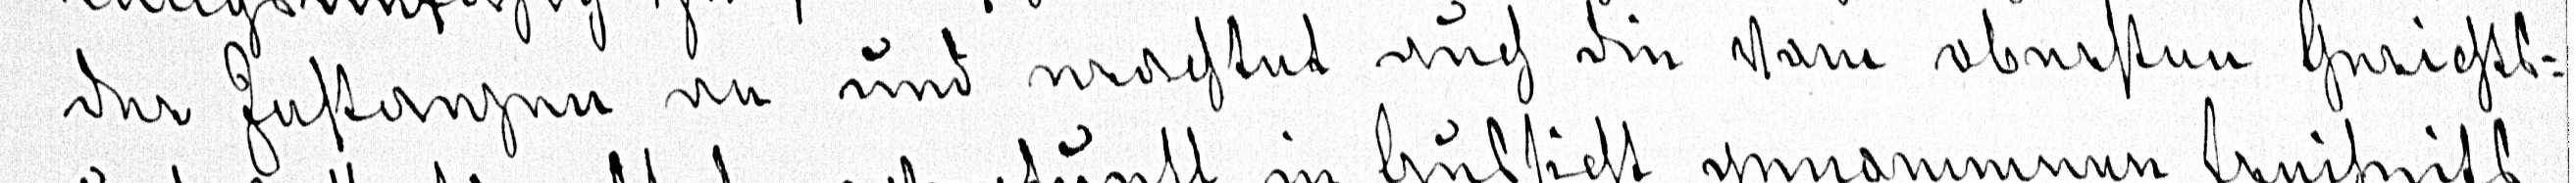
der Zustanzen er und erachtet auch die vom obersten Gerichts¬
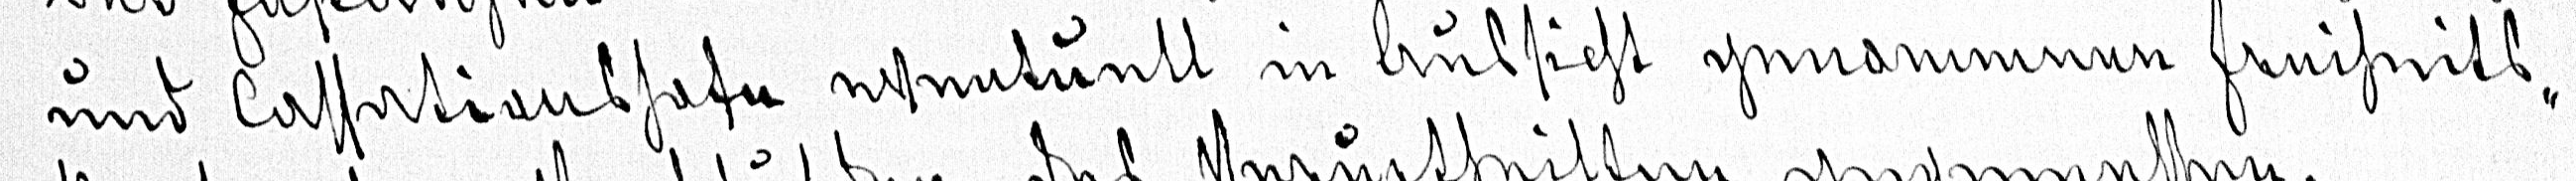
und Cassationshofe eventuell in Aussicht genommene Freiheits¬
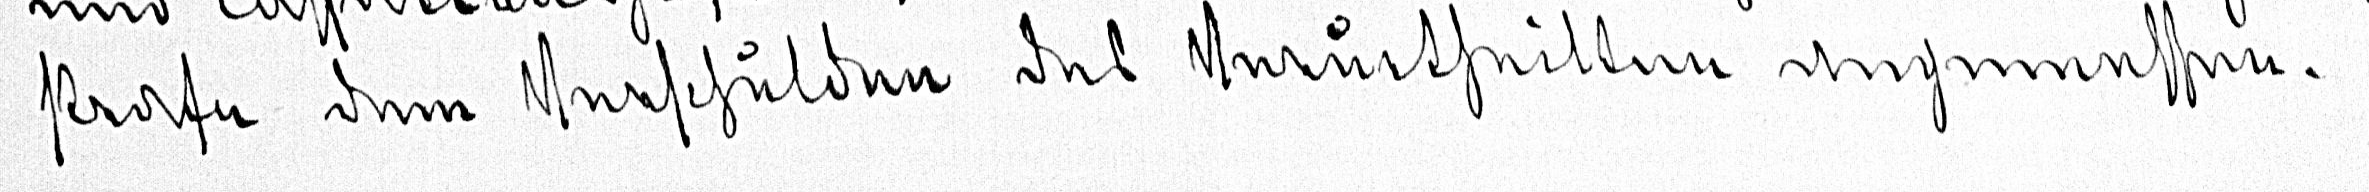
strafe dem Verschulden des Verurtheilten angemessen.
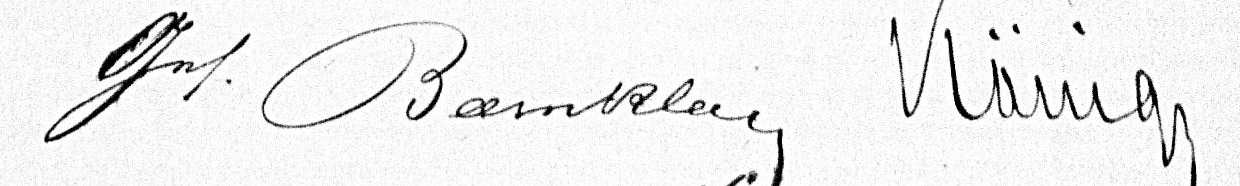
Ges. Barnklai König
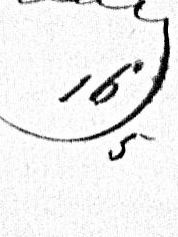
16
